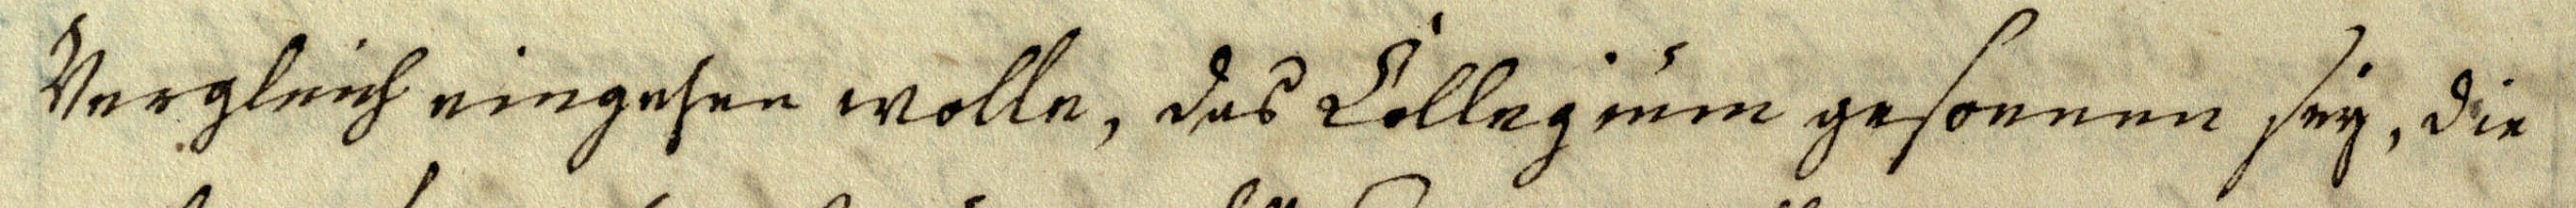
Vergleich eingehen wolle, das Collegium gesonnen seÿ, die
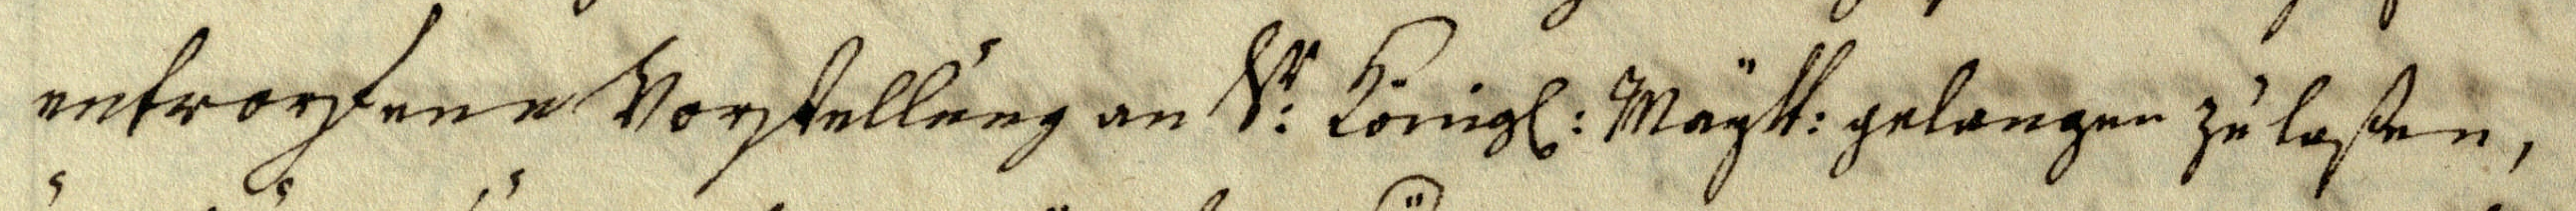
entworfenen Vorstellung an Sr.Königl. Maÿtt. gelangen zu laßen,
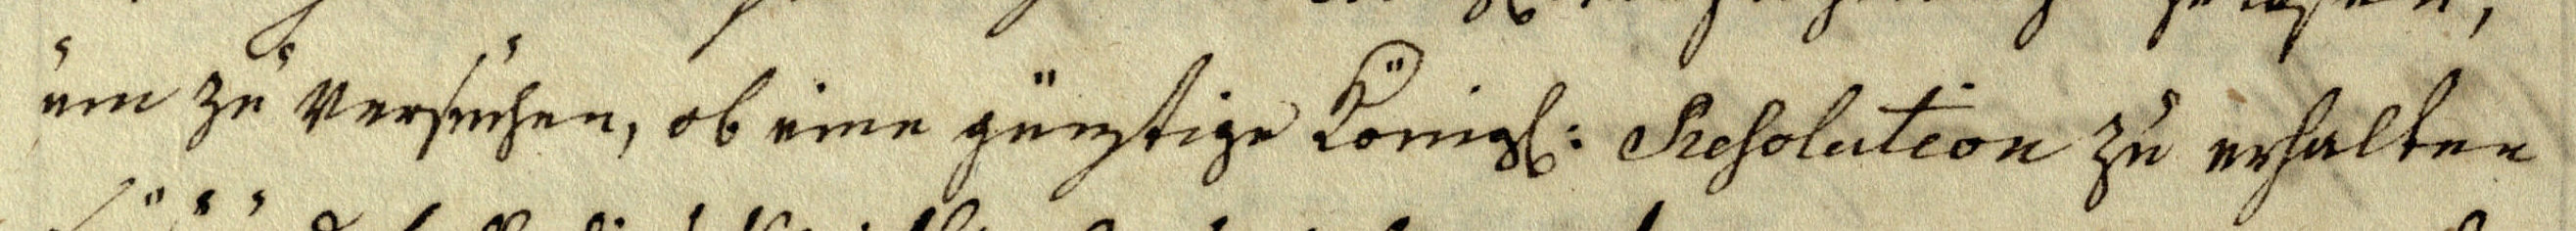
um zu versuchen, ob eine günstige Königl. Resolution zu erhalten
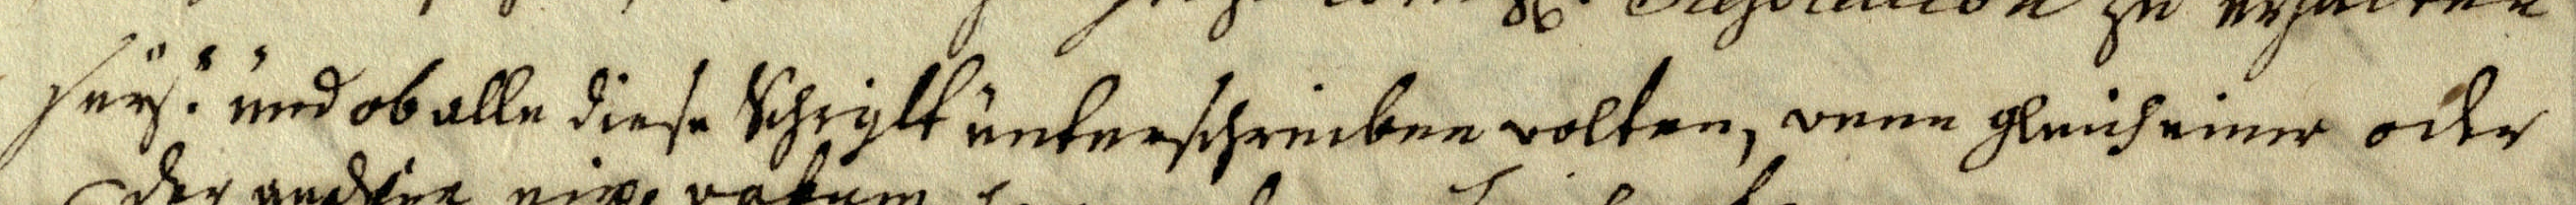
seÿ? und ob alle diese Schrift unterschreiben wolten, wenn gleich einer oder
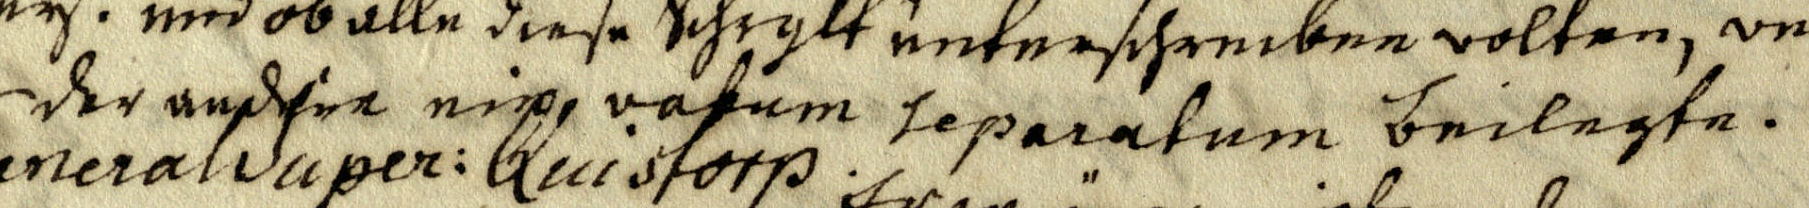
der andere ein votum separatum beilegte.
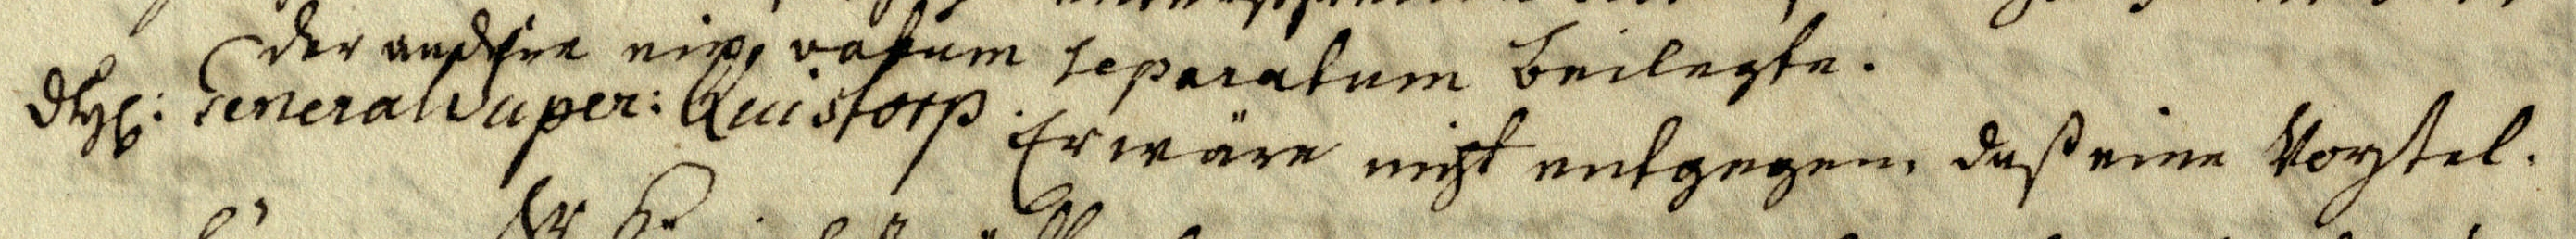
dh GeneralSuper. Quistorp. Er wäre nicht entgegen, daß eine Vorstel¬
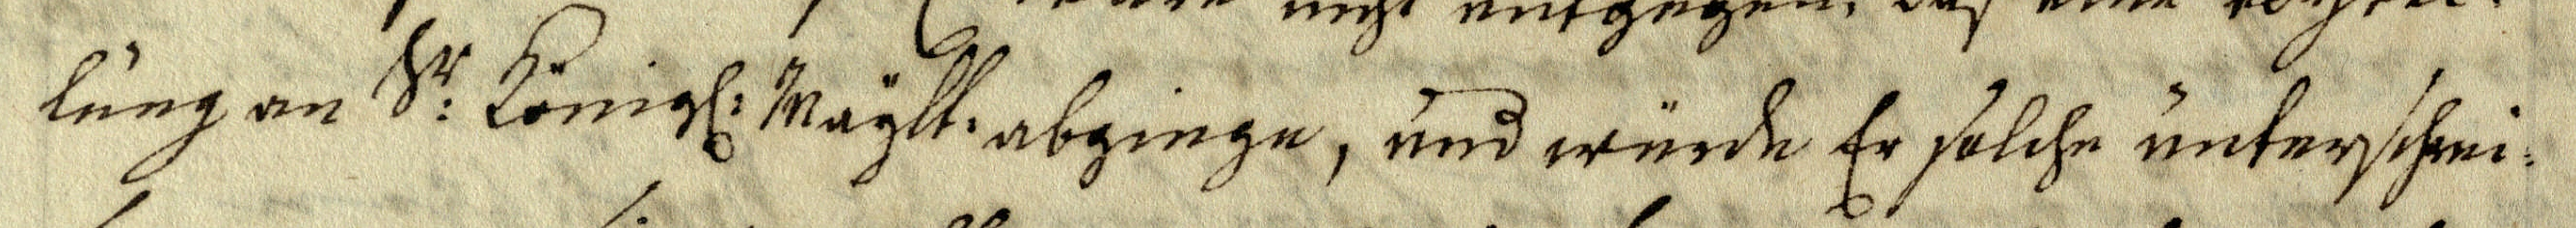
lung an Sr Königl. Maÿtt. abginge, und würde Er solche unterschrei¬
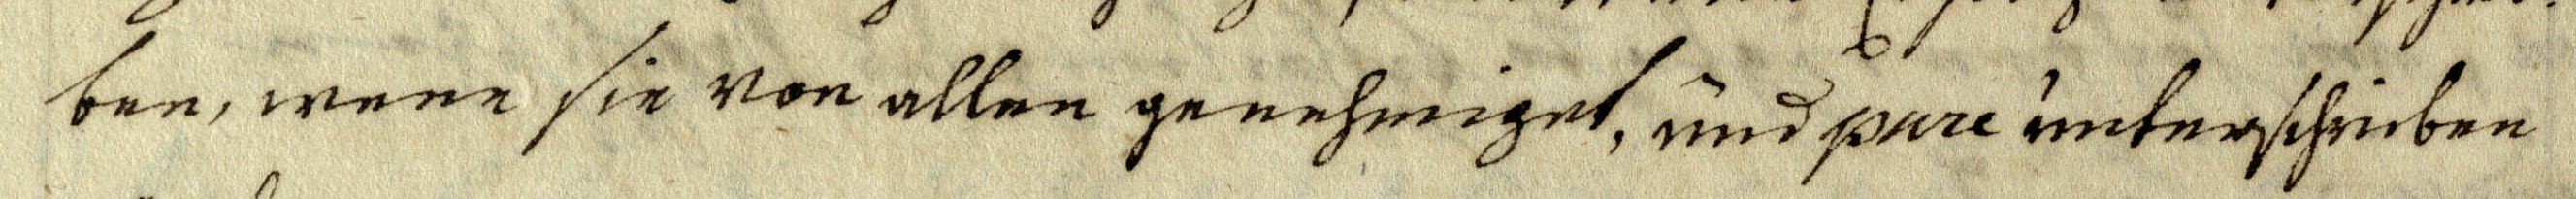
ben, wenn sie von allen genehmiget, und pure unterschrieben
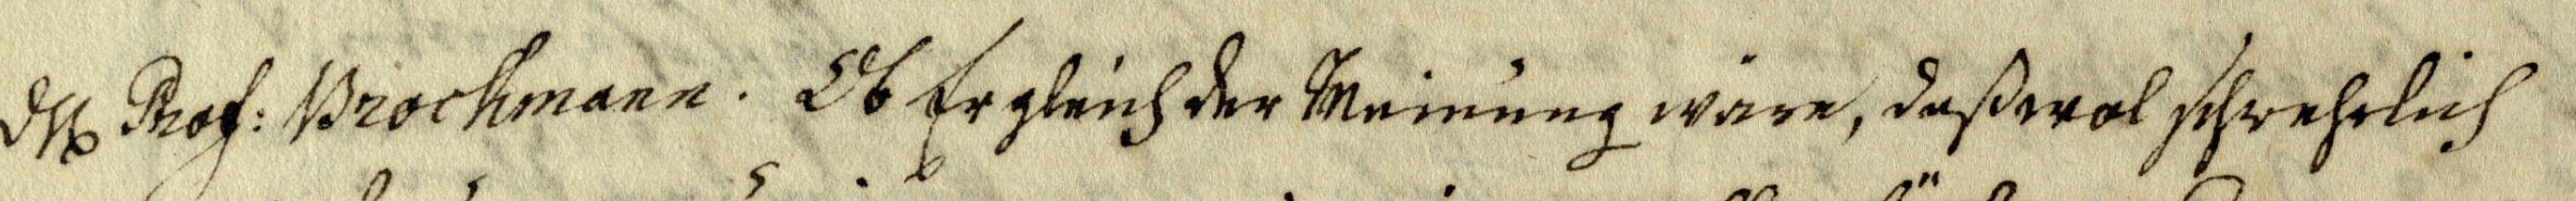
dh Prof. Brockmann. Ob Er gleich der Meinung wäre, daß wol schwehrlich
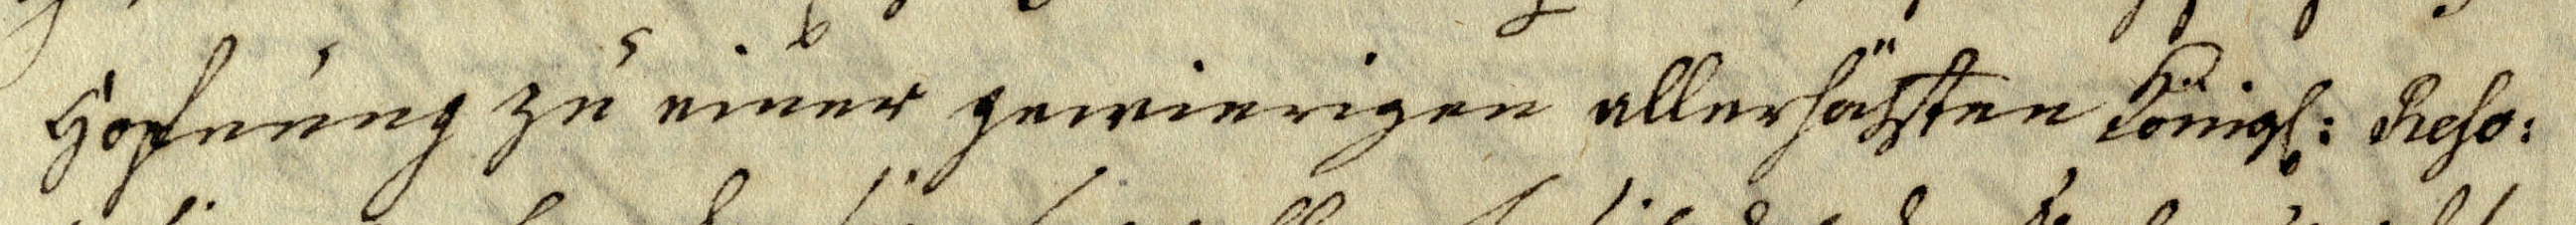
Hofnung zu einer gewinrigen allerhöchsten Königl. Reso¬
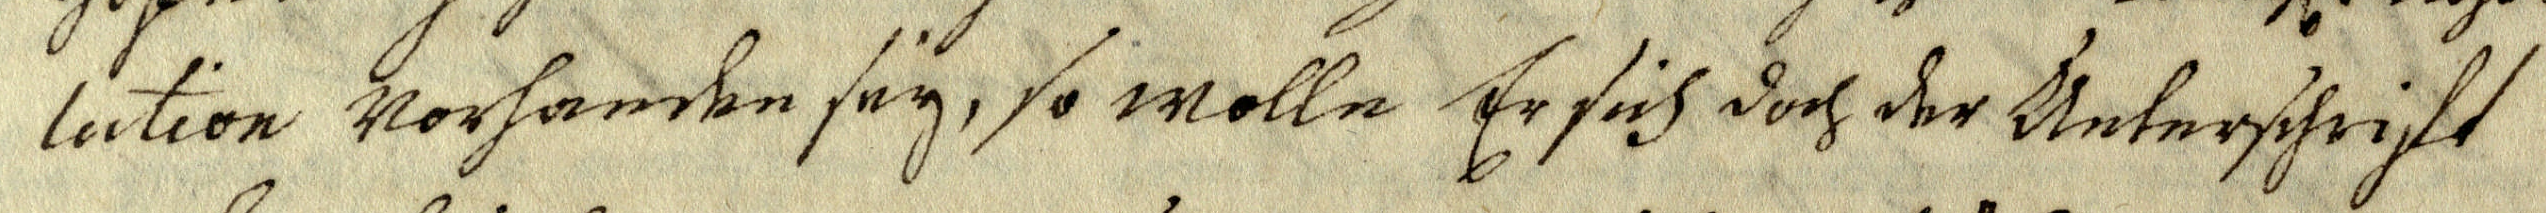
lution vorhanden seÿ, so wolle Er sich doch der Unterschrift
